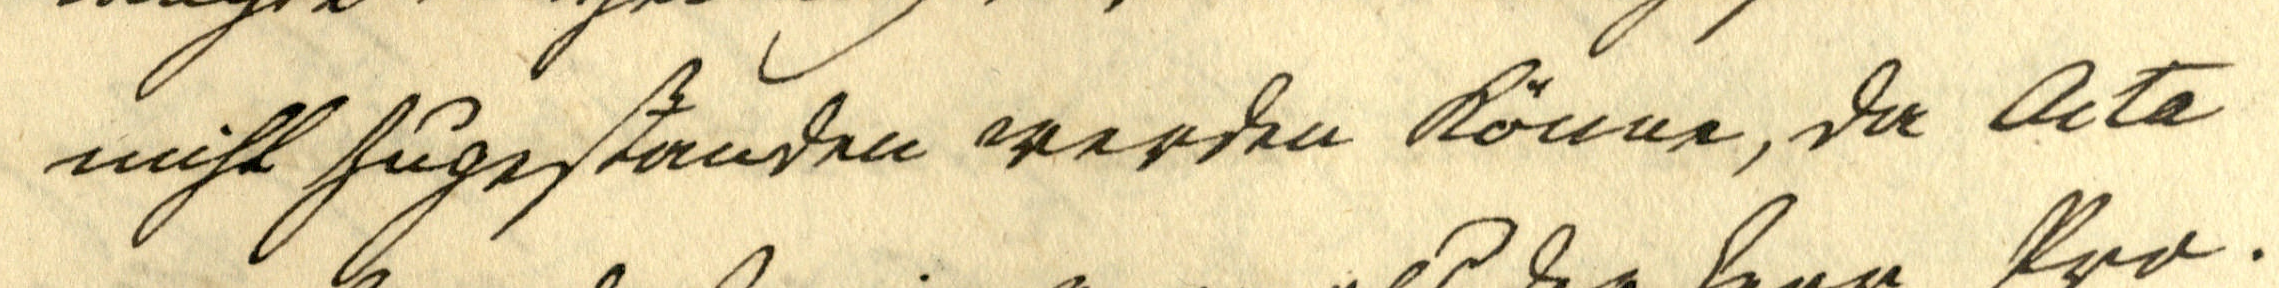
nicht zugestanden werden könne, da Acta
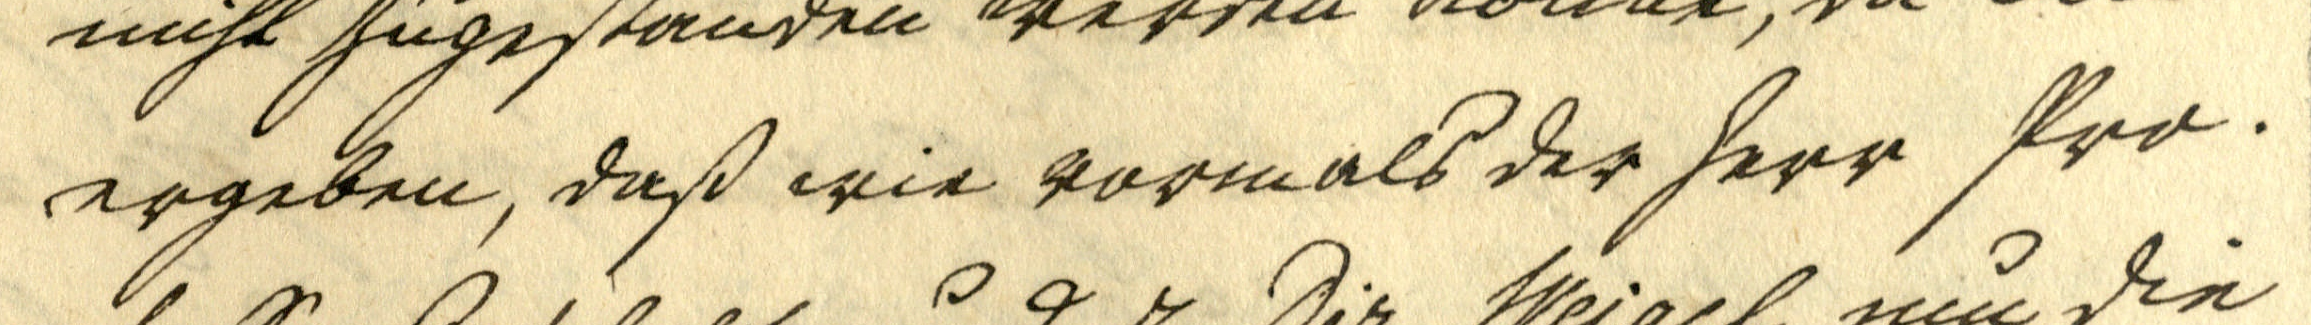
ergeben, daß wie vormals der Herr Pro¬
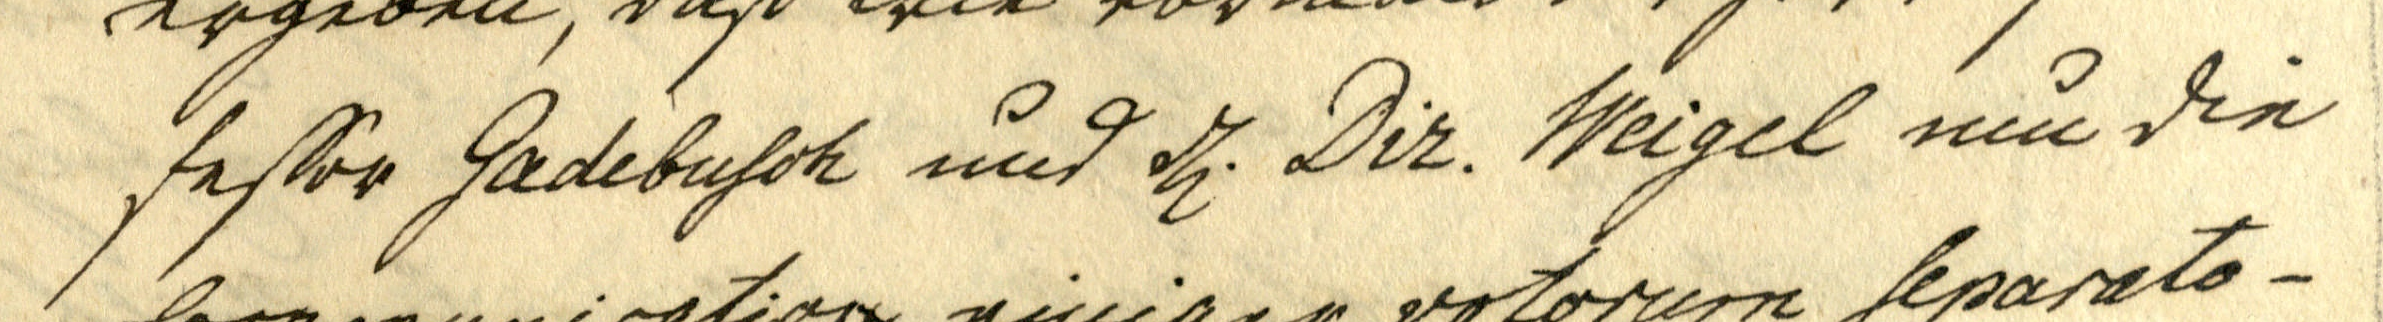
fessor Gadebusch und dh. Dir. Weigel um die
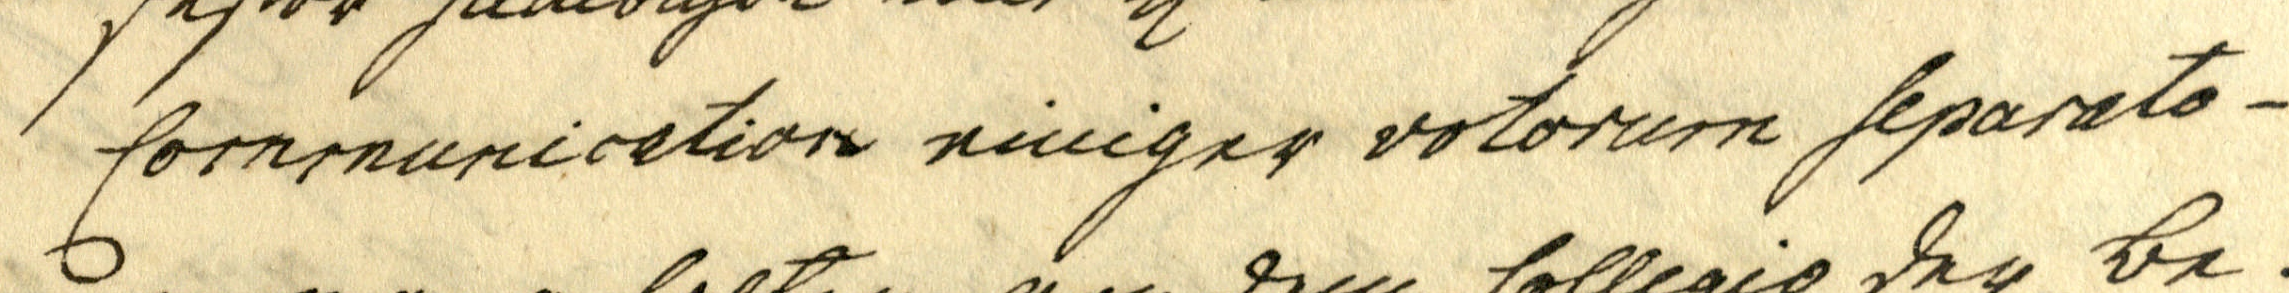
Communication einiger votorum separato¬
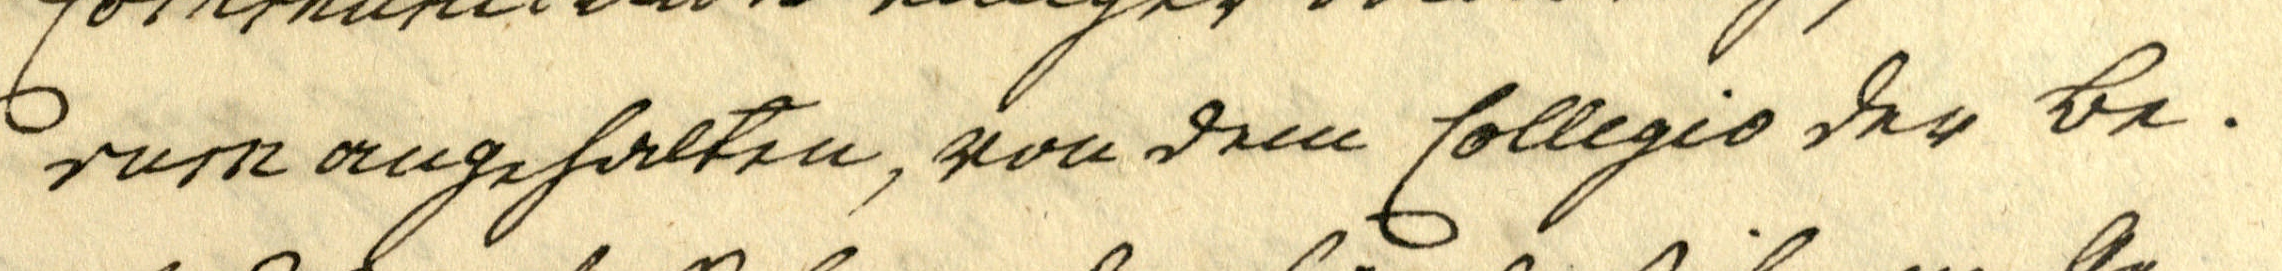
rum angehalten, von dem Collegio der Be¬
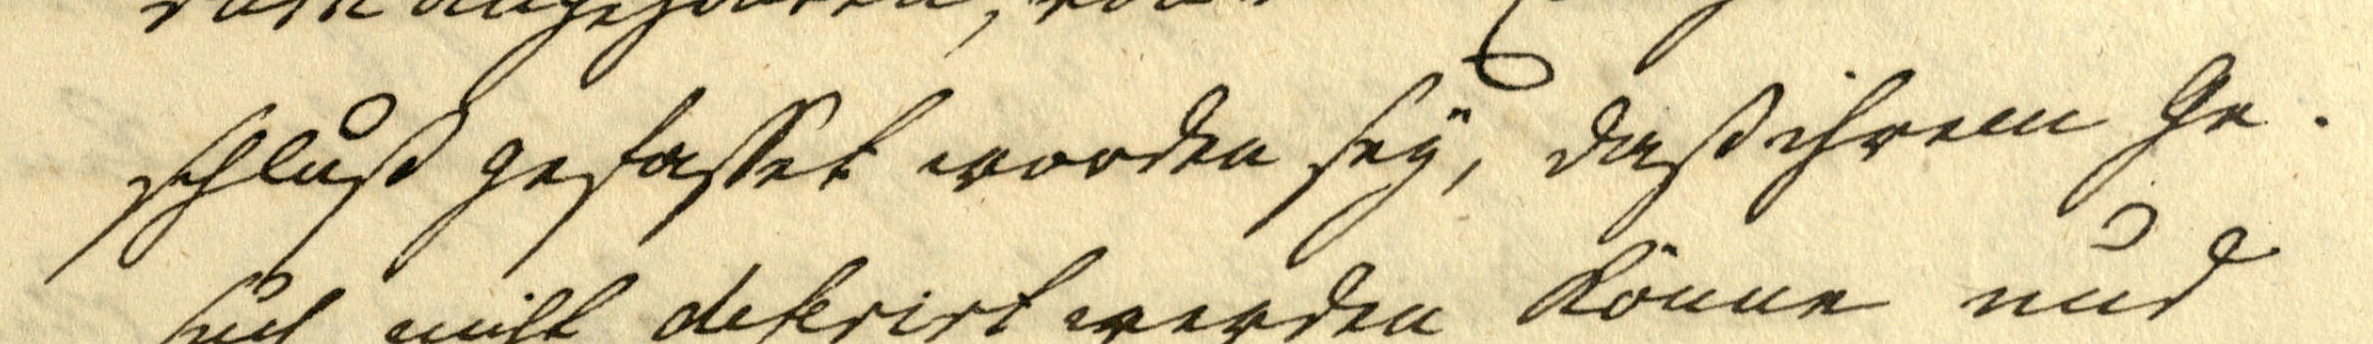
schluß gefasset worden seÿ, daß ihrem Ge¬
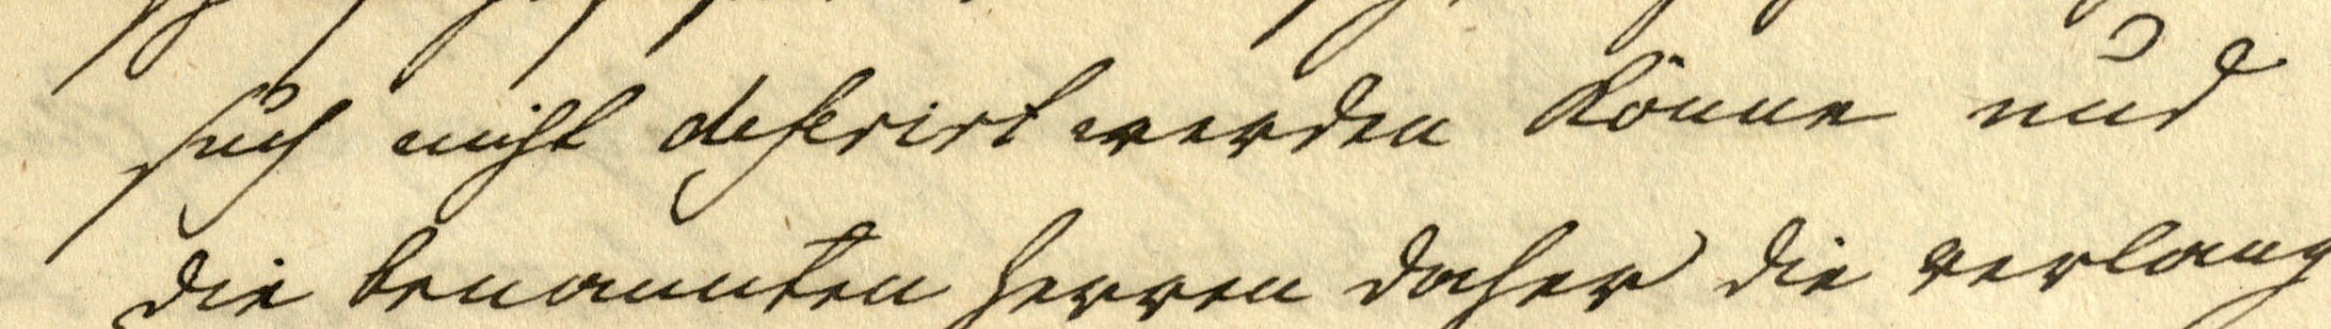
such nicht deferirt werden könne und
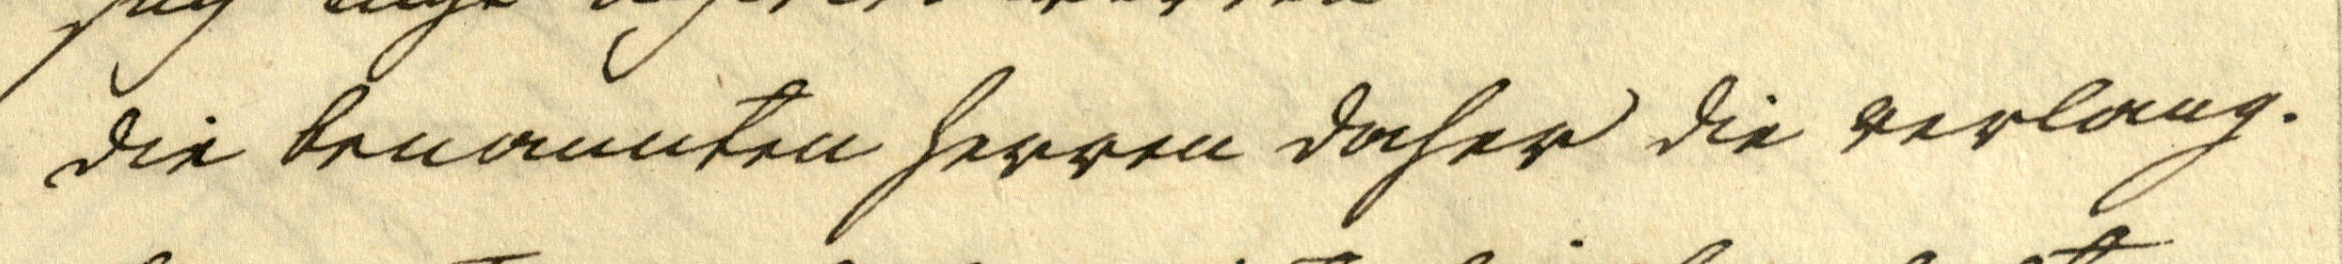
die benannten Herren daher die verlang¬
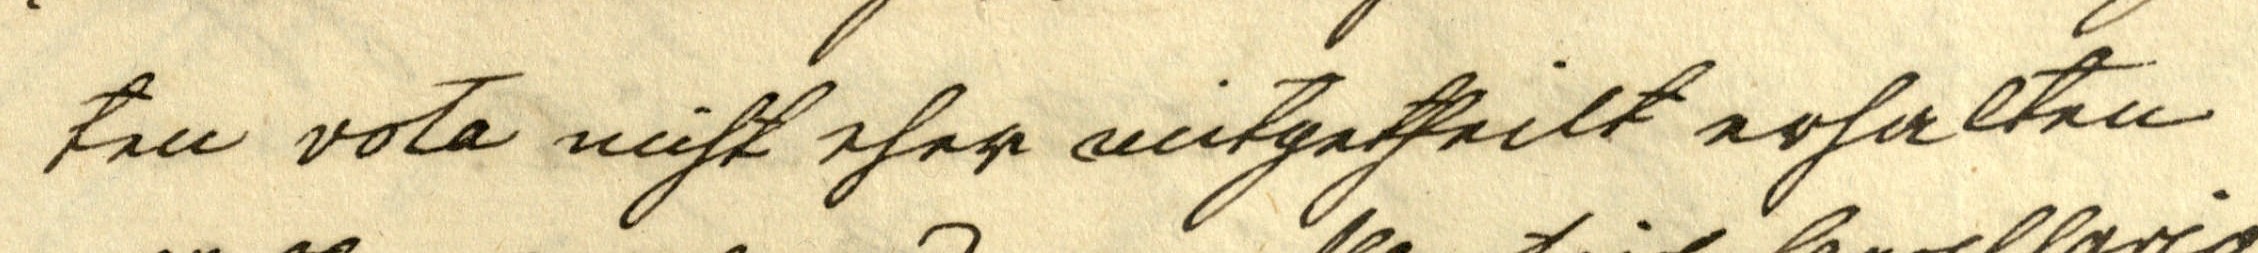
ten vota nicht eher mitgetheilt erhalten
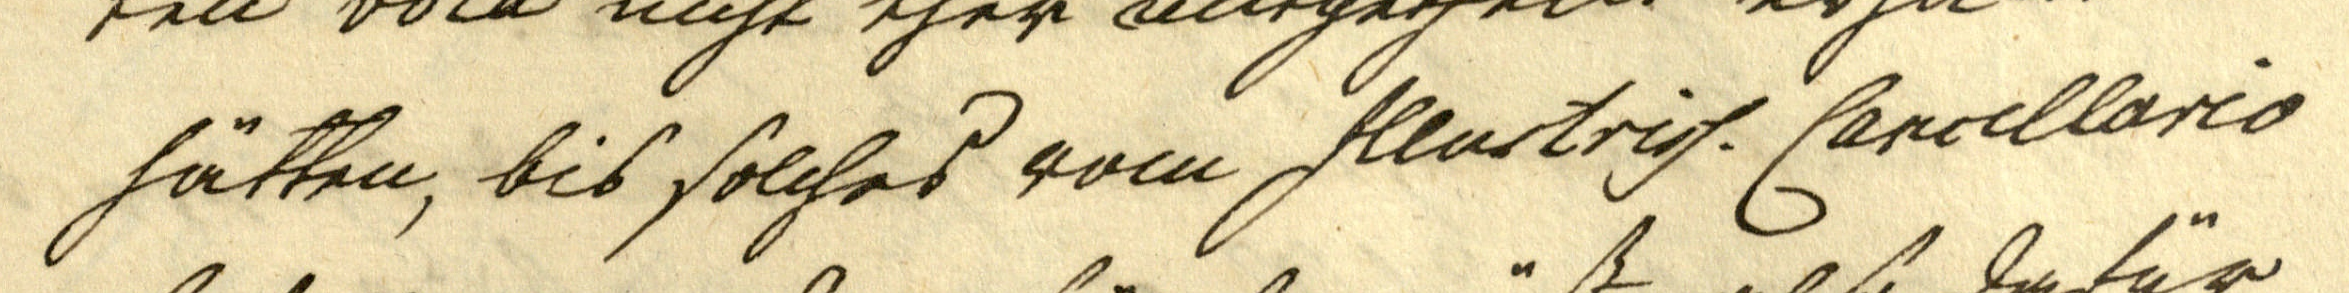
hätten, bis solches vom Illustriss. Cancellario
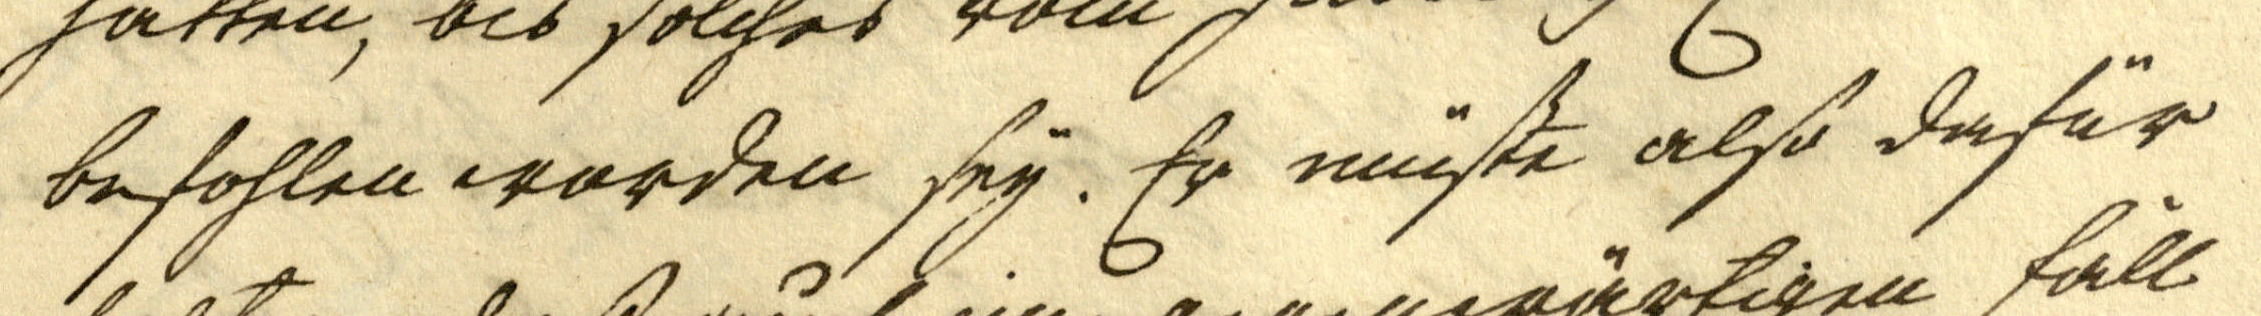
befohlen worden seÿ. Er müste also dafür
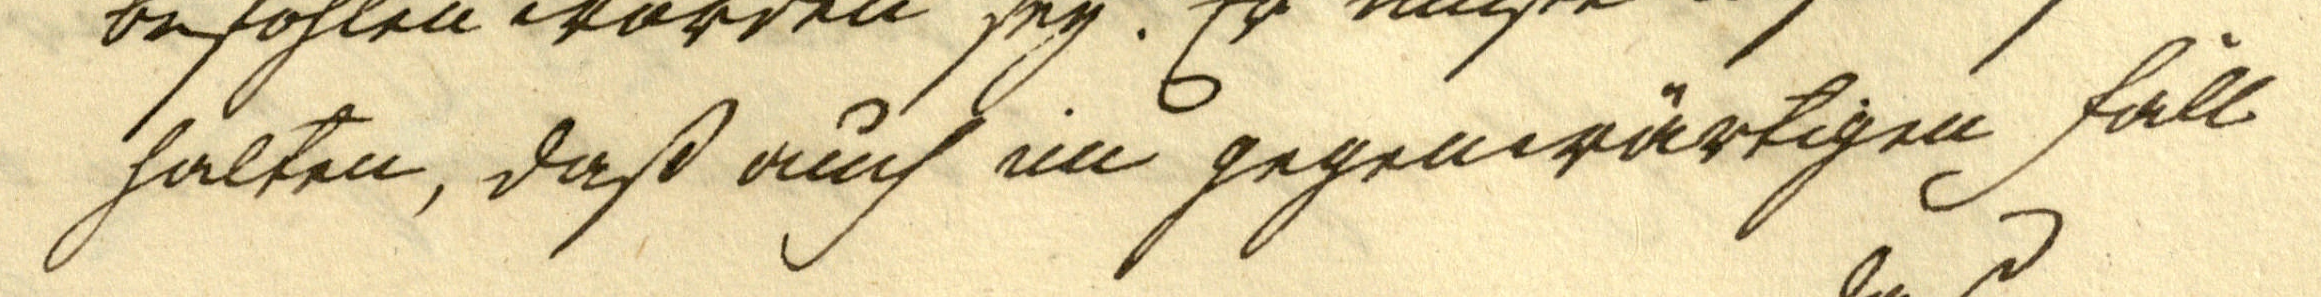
halten, daß auch im gegenwärtigen Fall
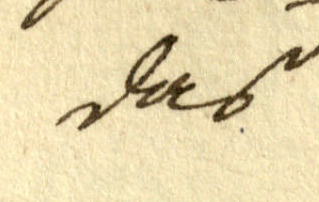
das
